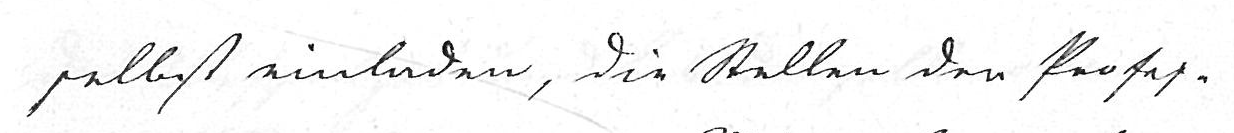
selbst einladen, die Stellen der Profes-
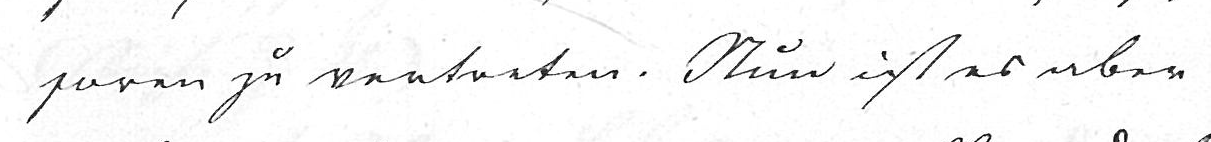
soren zu vertreten. Nun ist es aber
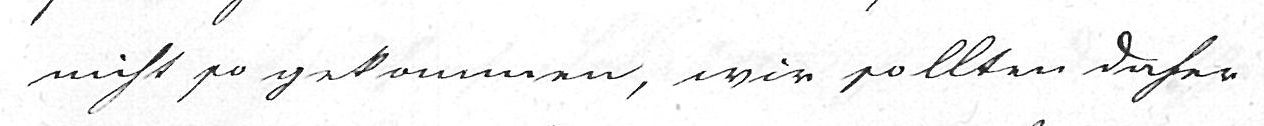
nicht so gekommen, wir sollten daher
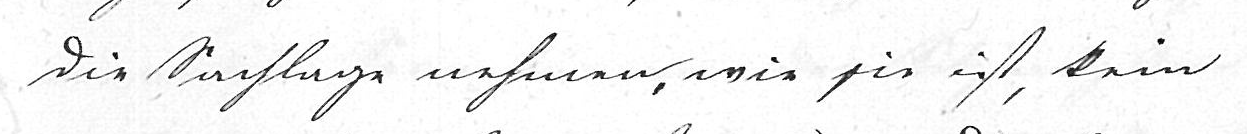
die Sachlage nehmen, wie sie ist, kein
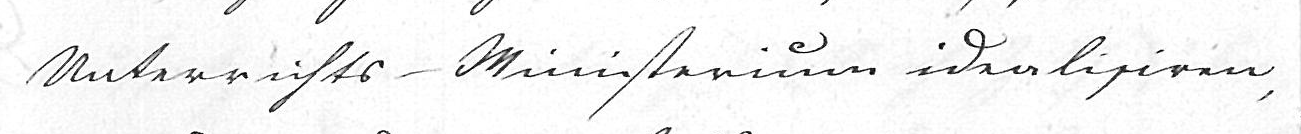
Unterrichts-Ministerium idealisiren,
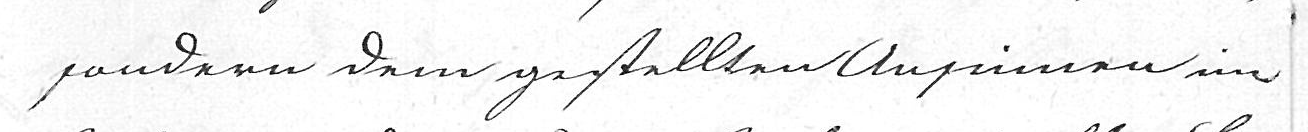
sondern dem gestellten Ansinnen im
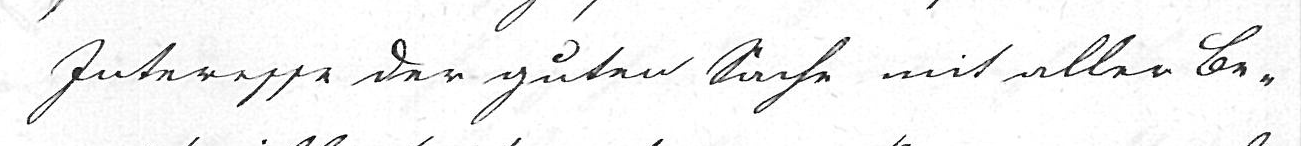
Interesse der guten Sache mit aller Be-
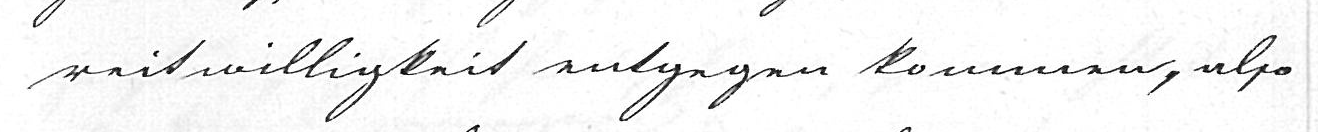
reitwilligkeit entgegen kommen, also
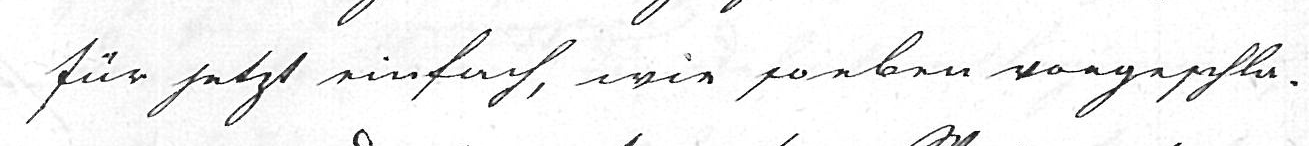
für jetzt einfach, wie soeben vorgeschla-
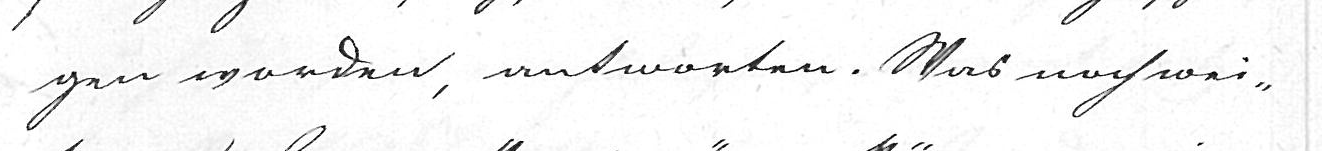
gen worden, antworten. Was noch wei-
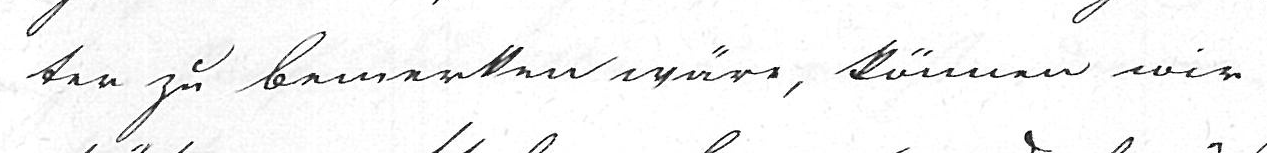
ter zu bemerken wäre, können wir
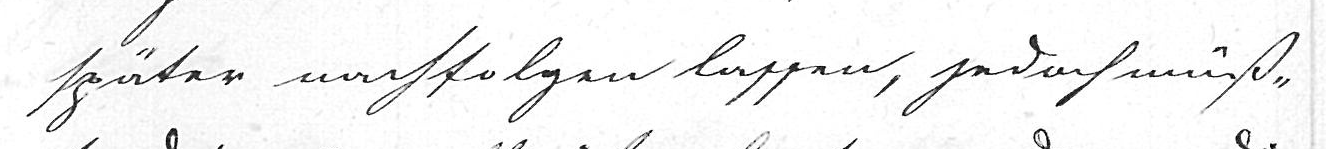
später nachfolgen lassen, jedoch müß-
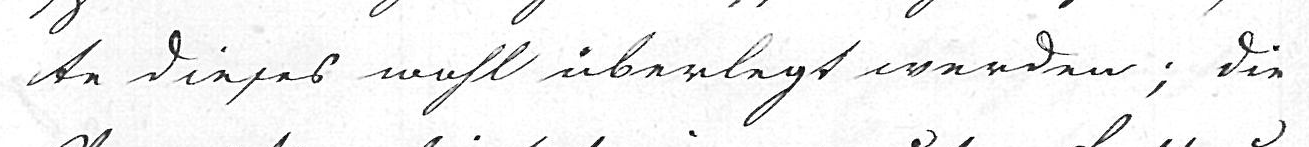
te dieses wohl überlegt werden; die
